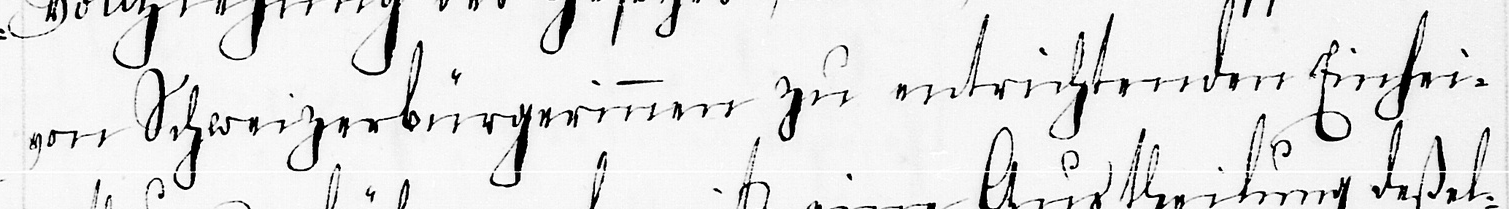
von Schweizerbürgerinnen zu entrichtenden Einhei¬
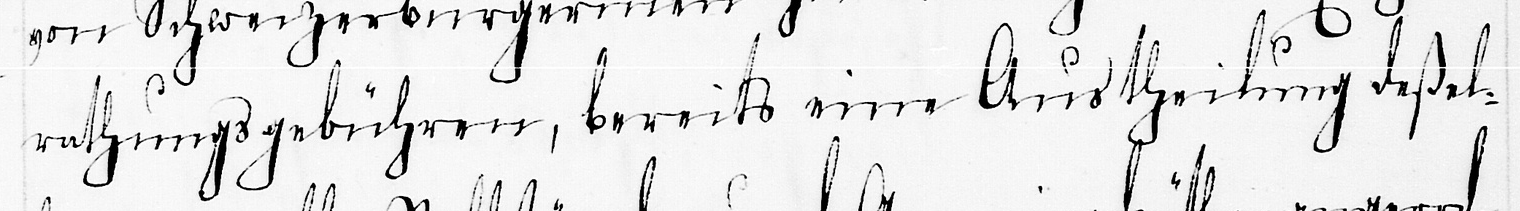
rathungsgebühren, bereits eine Austheilung deßel¬
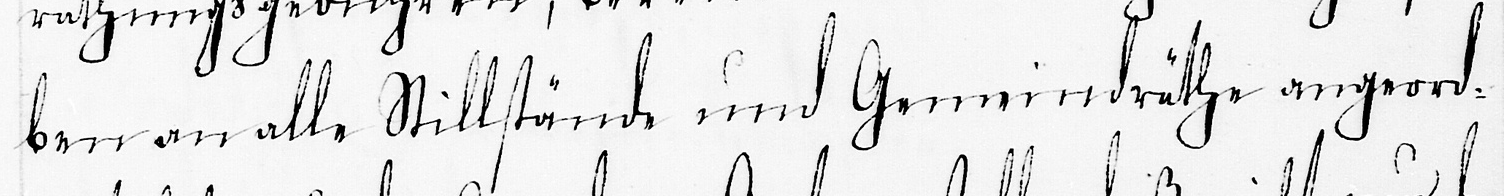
ben an alle Stillstände und Gemeindräthe angeord¬
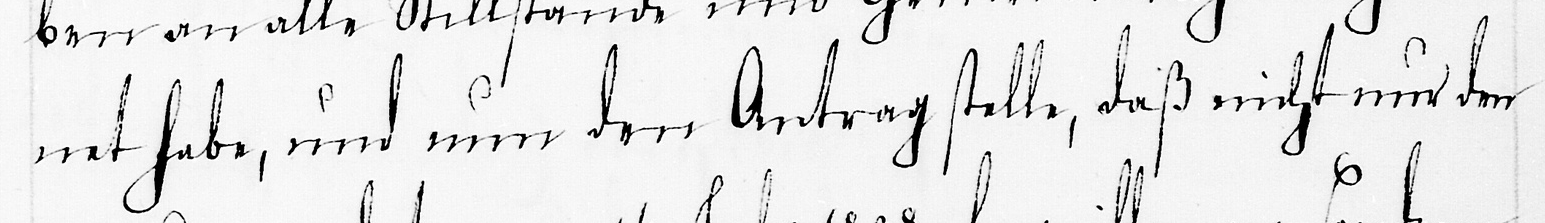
net habe, und nun den Antrag stelle, daß nicht nur den
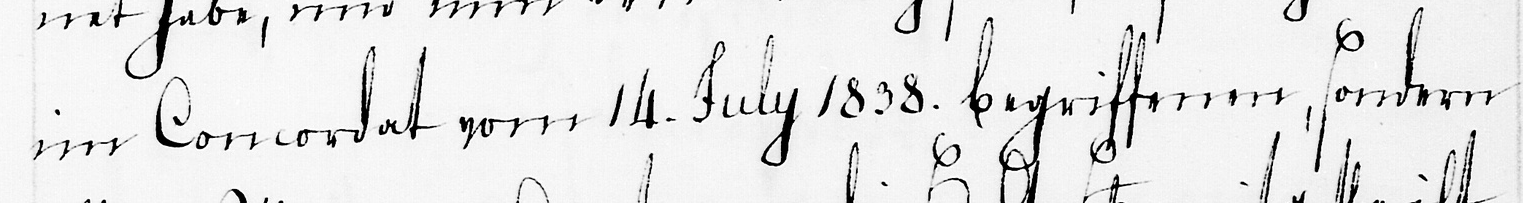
im Concordat vom 14. July 1838. begriffenen, sondern
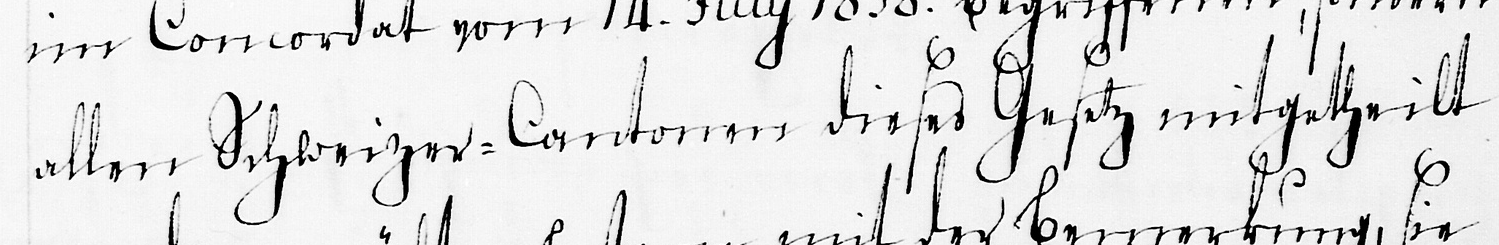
allen Schweizer-Cantonen dieses Gesetz mitgetheilt
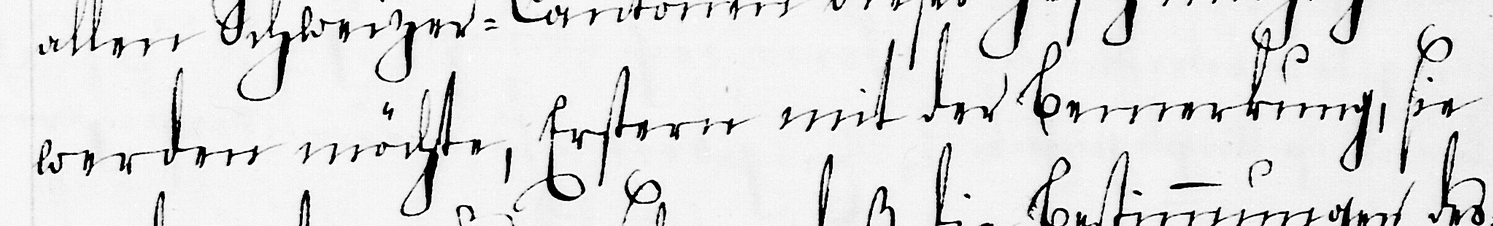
werden möchte, Erstern mit der Bemerkung, sie
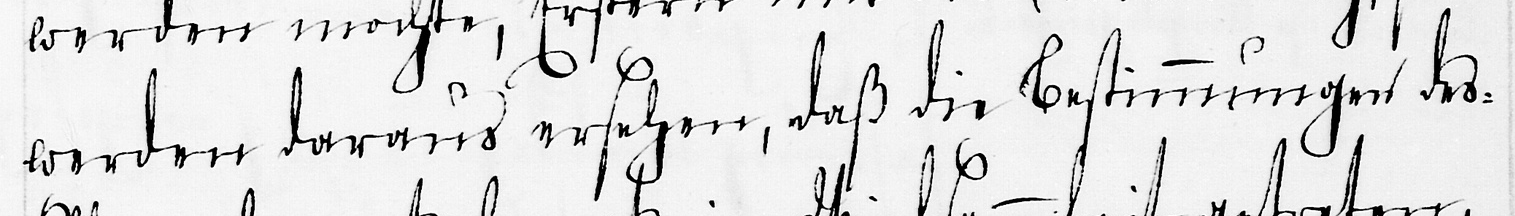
werden daraus ersehen, daß die Bestimmungen des¬
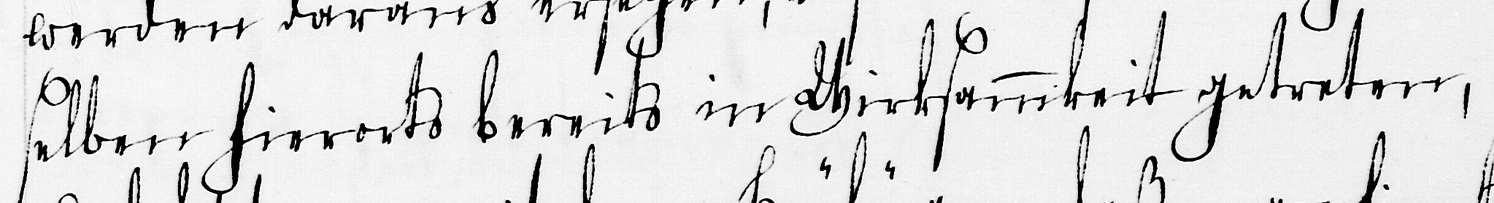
selben hierorts bereits in Wirksammkeit getreten,
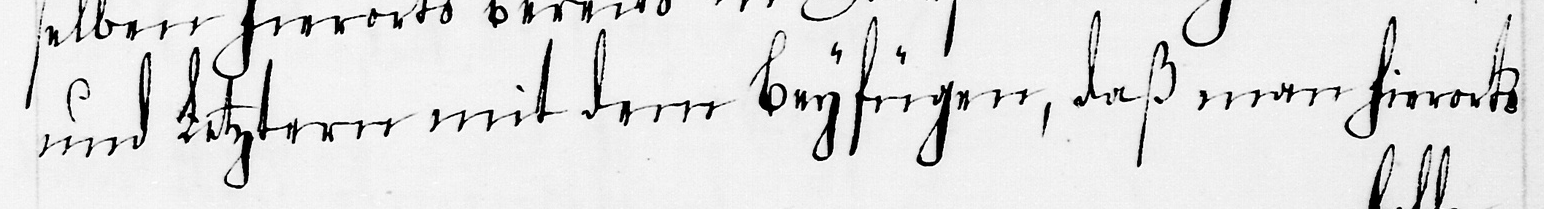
und Letztern mit dem Beyfügen, daß man hierorts
